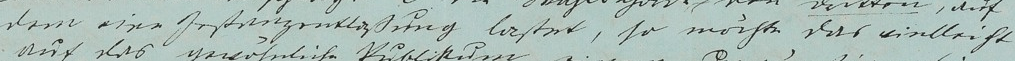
dem eine Instanzentlaßung lastet, so möchte das vielleicht
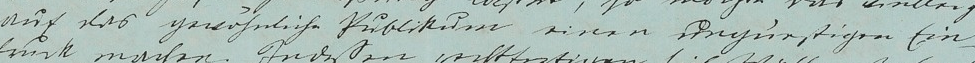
auf das gewöhnliche Publikum einen ungünstigen Ein-
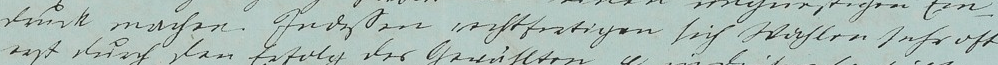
druck machen. Indeßen rechtfertigen sich Wahlen sehr oft
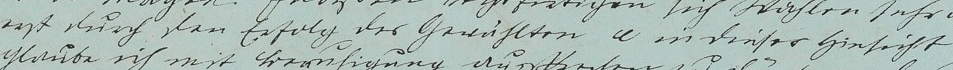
erst durch den Erfolg des Gewählten & in dieser Hinsicht
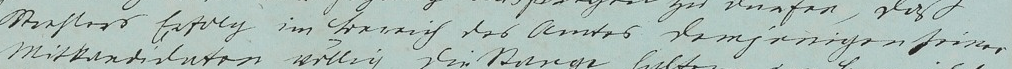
Strehlers Erfolg im Bereich des Amtes demjenigen seiner
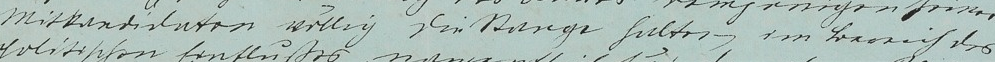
Mitkandidaten völlig die Stange halten, im Bereich des
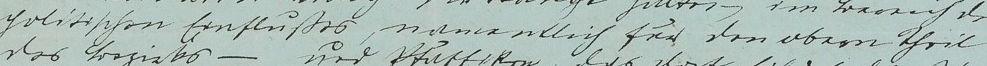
politischen Einflußes, namentlich für den obern Theil
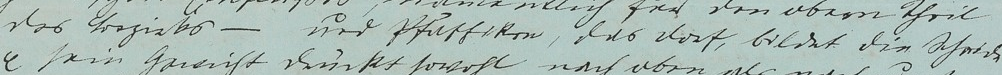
des Bezirks – und Pfäffikon, das Dorf, bildet die Scheide
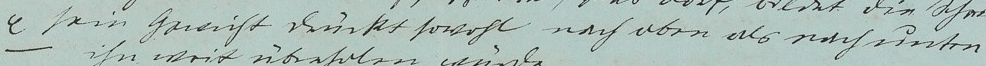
& sein Gewicht drückt sowohl nach oben als nach unten
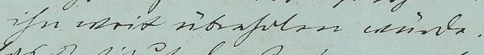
ihn weit überholen würde.
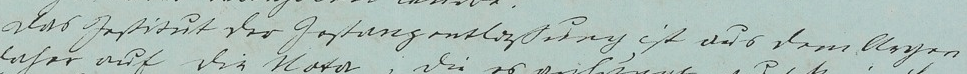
Das Institut der Instanzentlaßung ist aus dem Argen
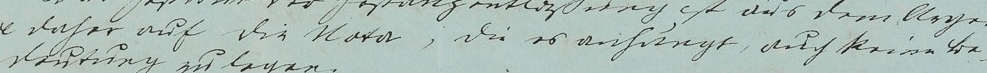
& daher auf die Nota, die es anhängt, auch keine Be-
